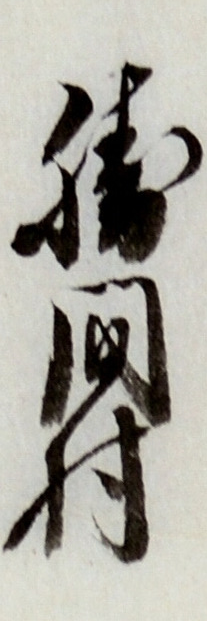勝間村
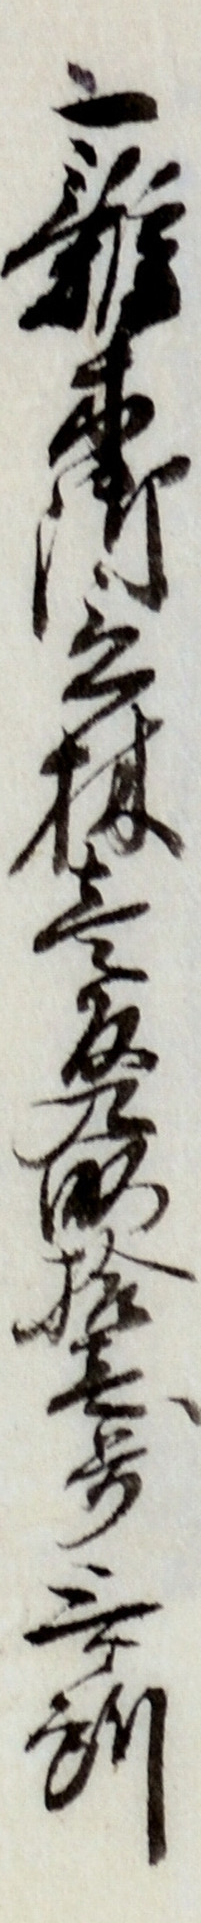一雑木御立林壱反九畝拾壱歩三ヶ所
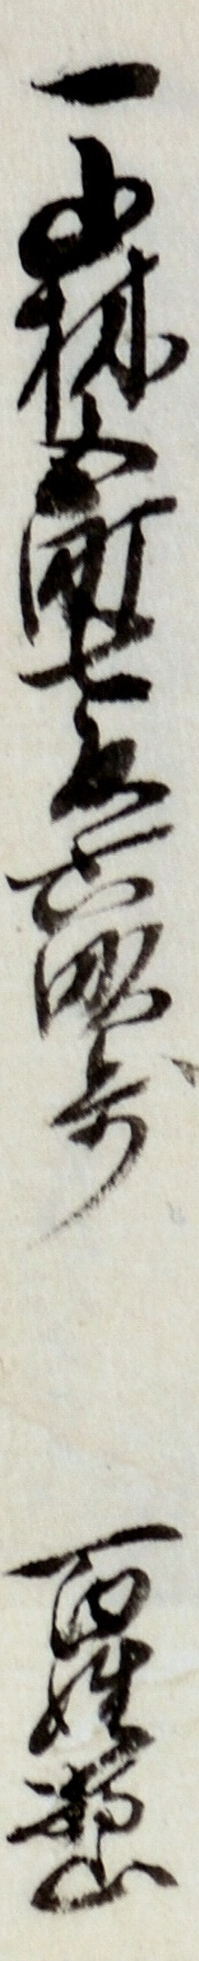一山林五町七反六畝歩百姓持山
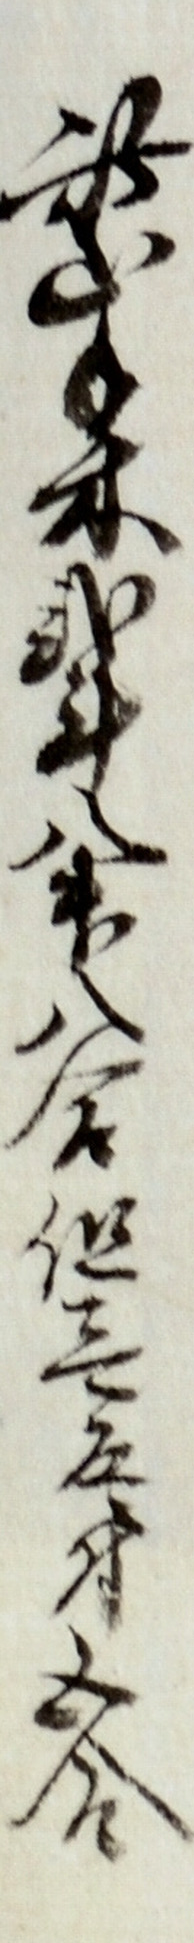此山手米弐斗八升八合但壱反ニ付五合
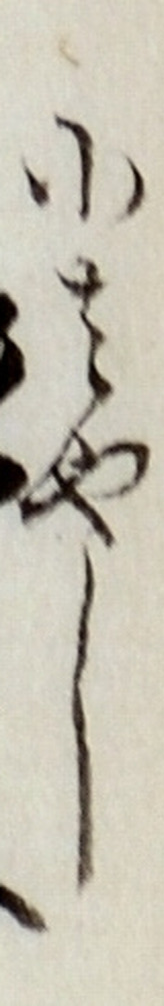小はやし
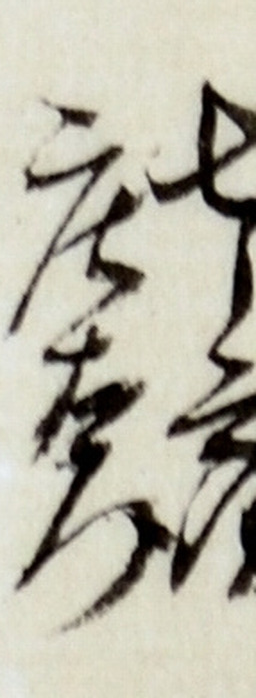庄右衛門
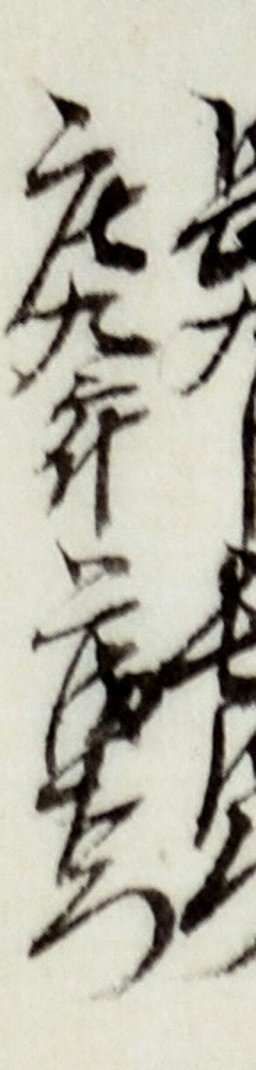庄九郎茂右衛門
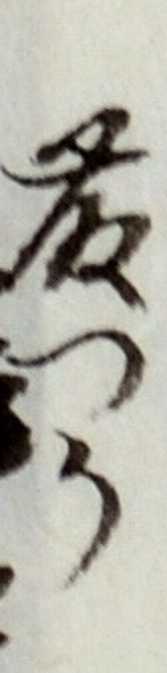藤つう
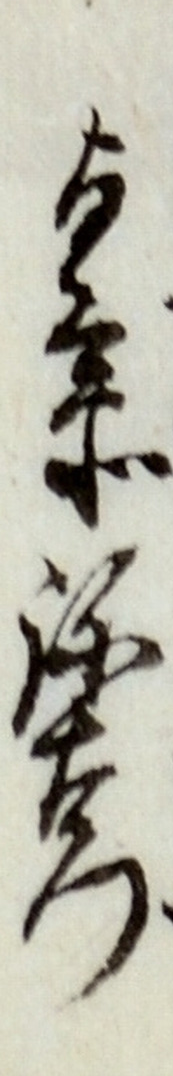与兵衛弥右衛門
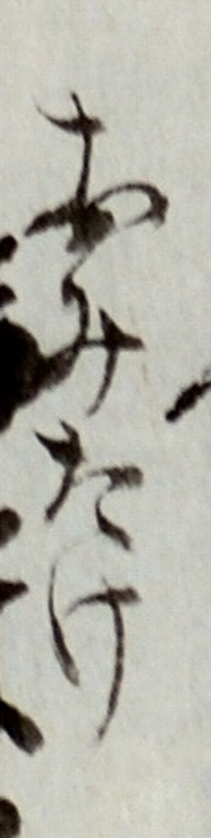おみたけ
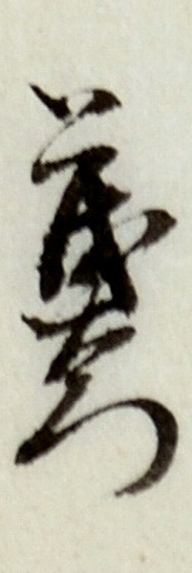庄右衛門
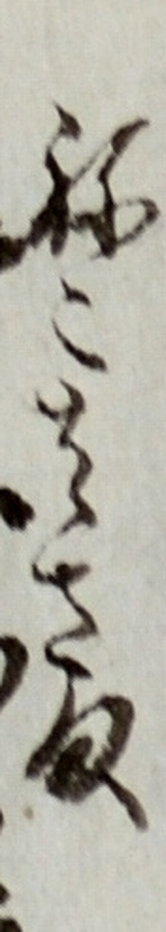ねこはさま
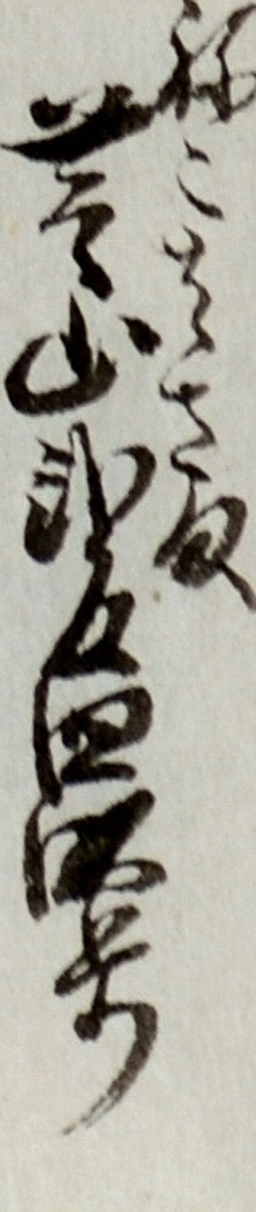芝山弐反四畝歩同断
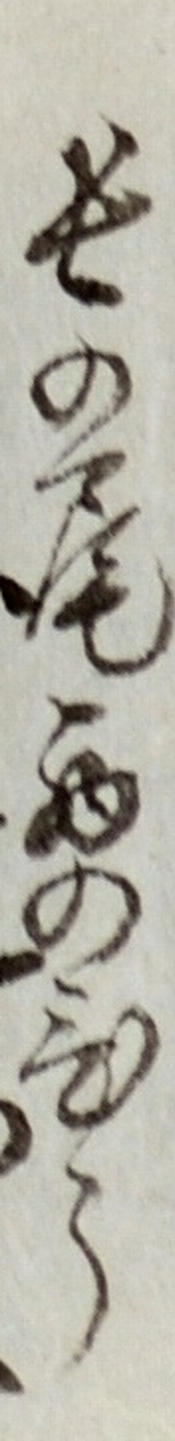長の尾西のひう
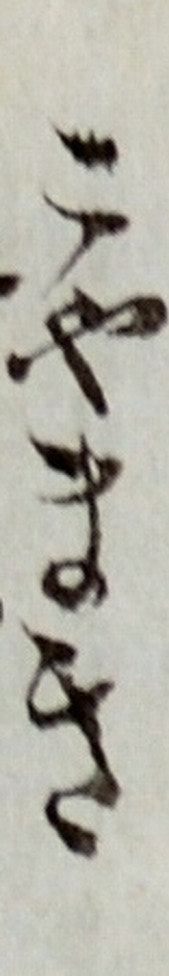こやまき

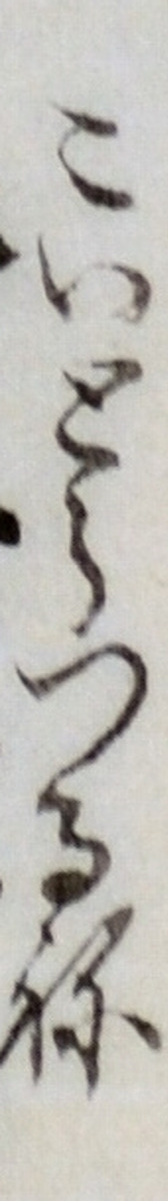こいとうつるね
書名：御領分中山林社地手控
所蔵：伊那市立高遠町図書館・合同会社AMANE
